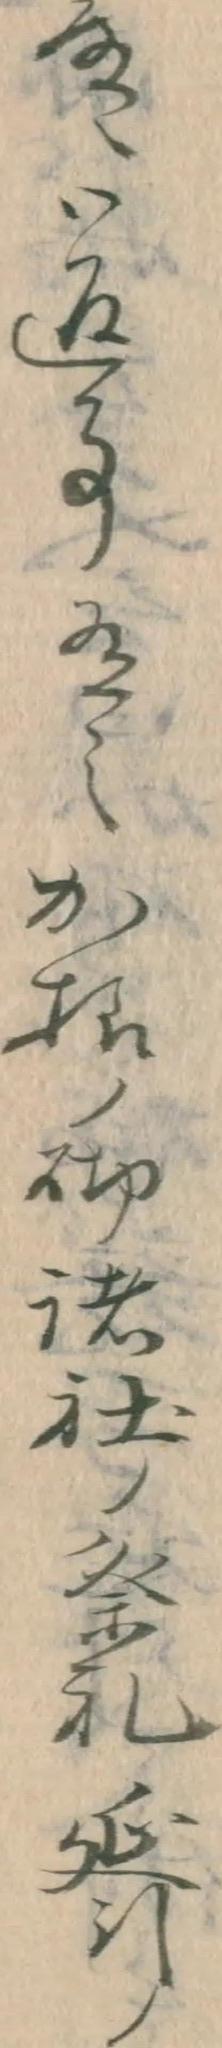殿へ御返事有之か様ノ砌諸社ノ祭礼延引ノ
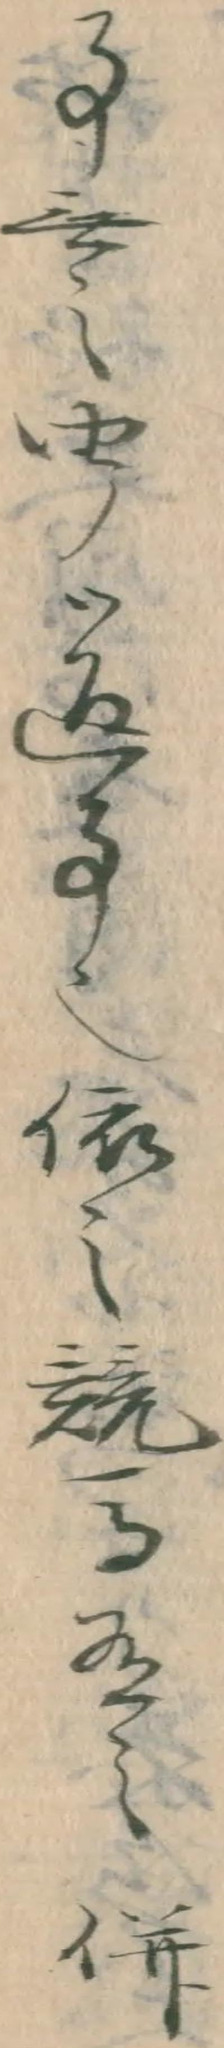事無之由ノ御返事也依之競馬有之併
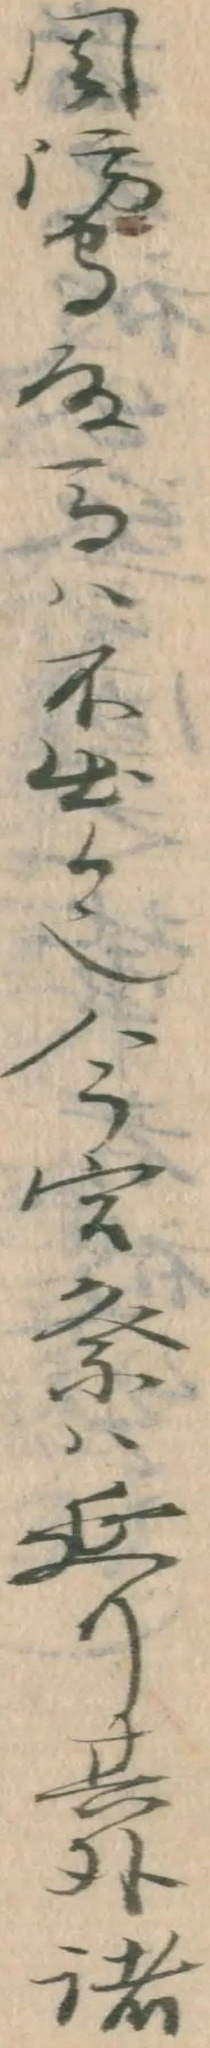周防守殿馬ハ不出候也今宮祭ハ延引其外諸
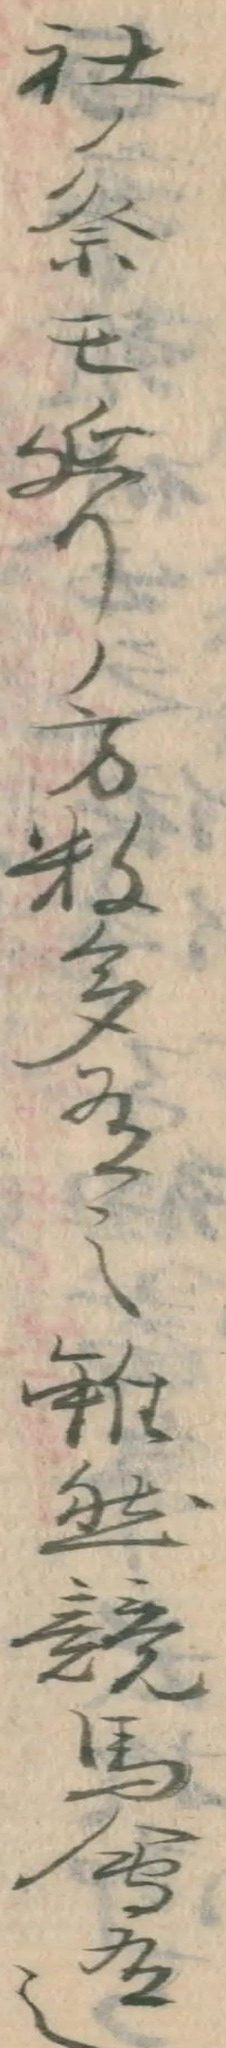社ノ祭モ延引ノ方数多有之雖然競馬会有之
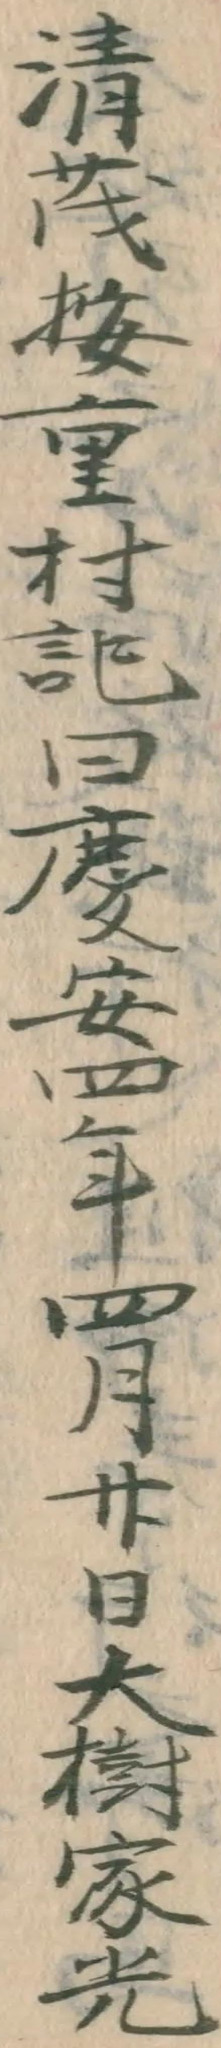清茂按重村記曰慶安四年四月廿日大樹家光
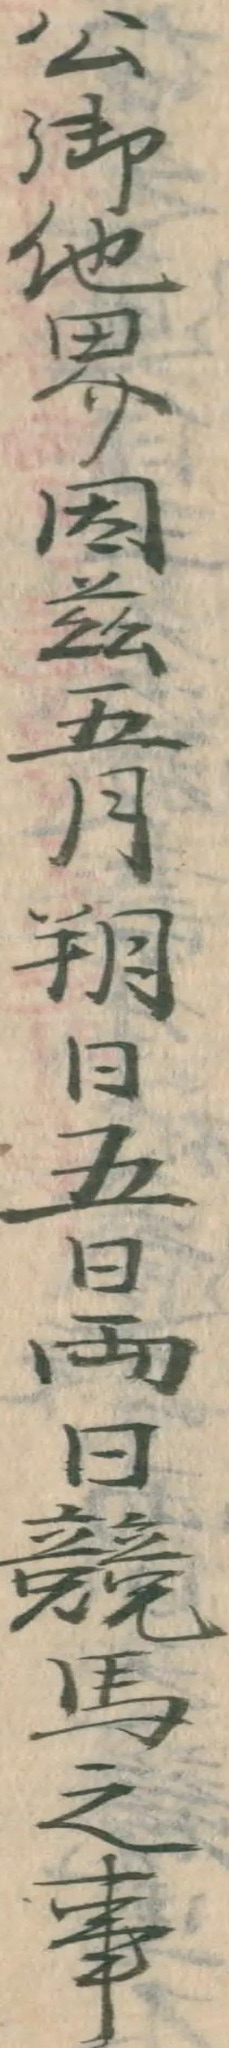公御他界因茲五月朔日五日両日競馬之事
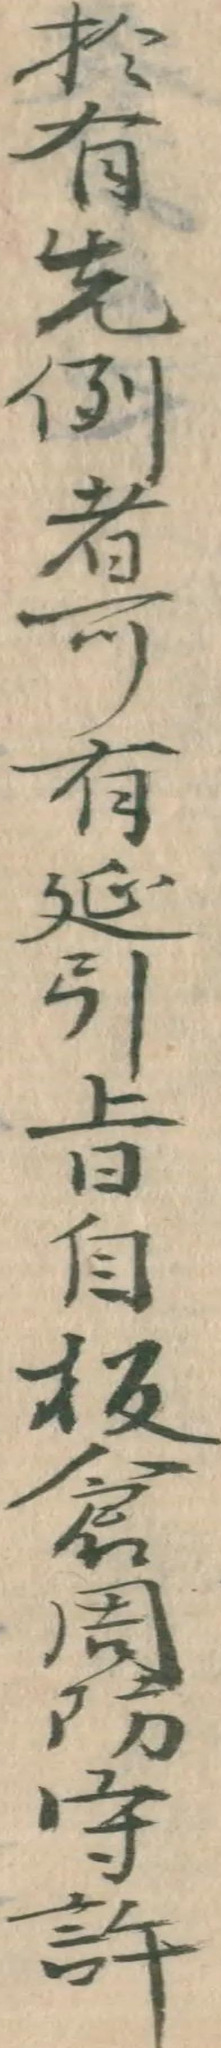於有先例者可有延引旨自板倉周防守許
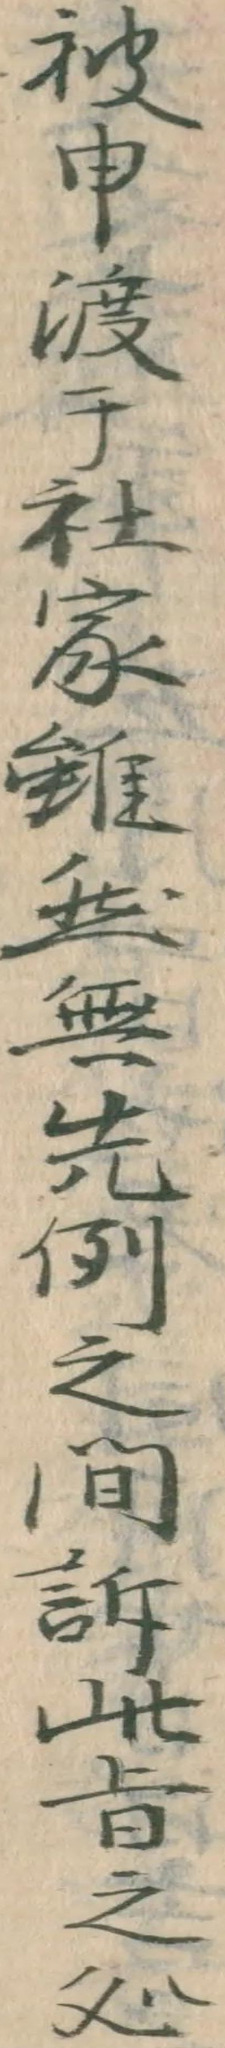被申渡于社家雖然無先例之間訴此旨之処
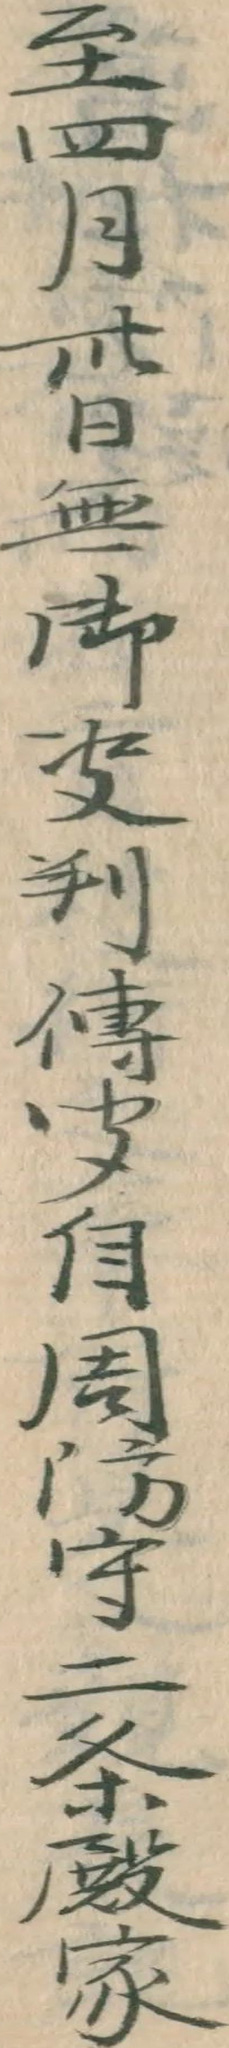至四月卅日無御決判伝聞自周防守二条殿家
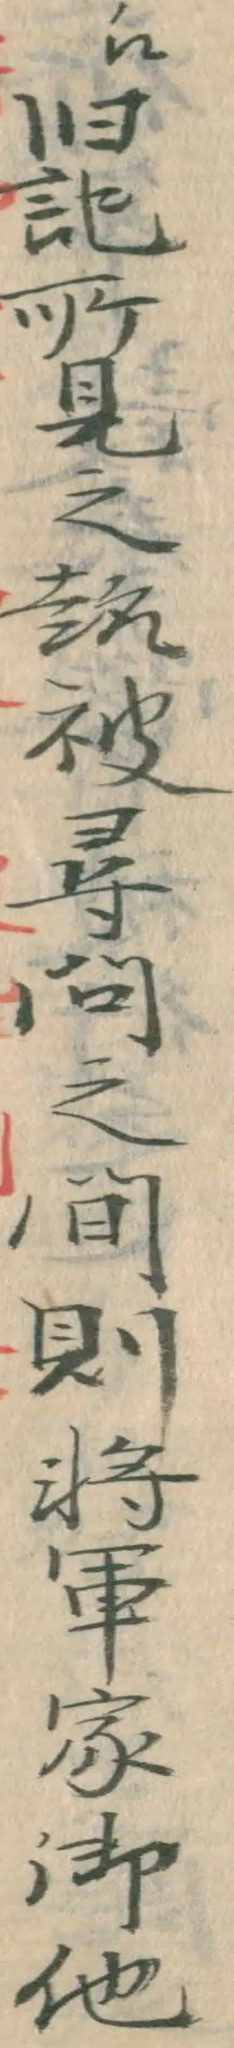江旧記所見之趣被尋問之間則将軍家御他
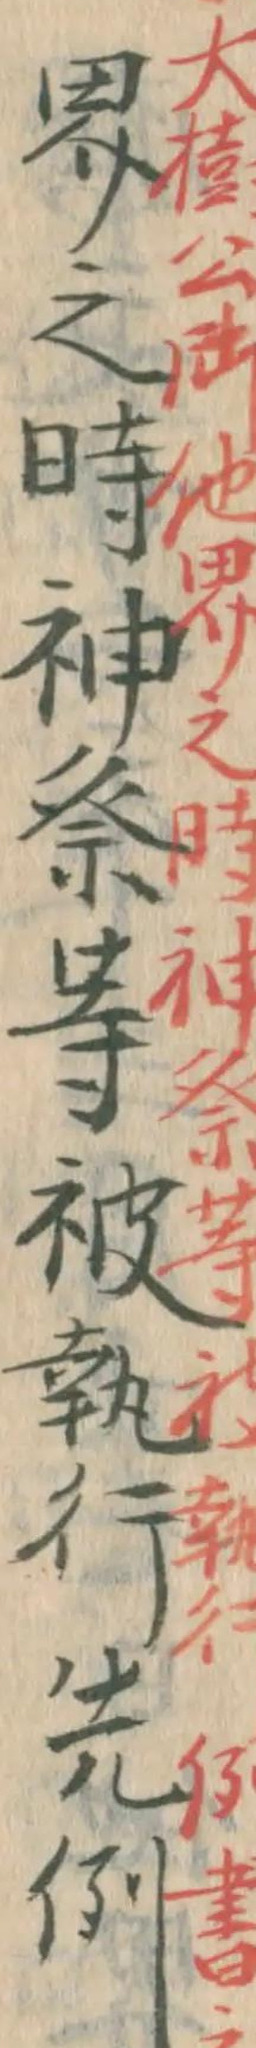界之時神祭等被執行先例
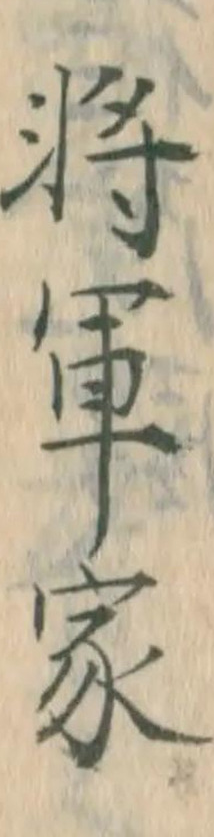将軍家

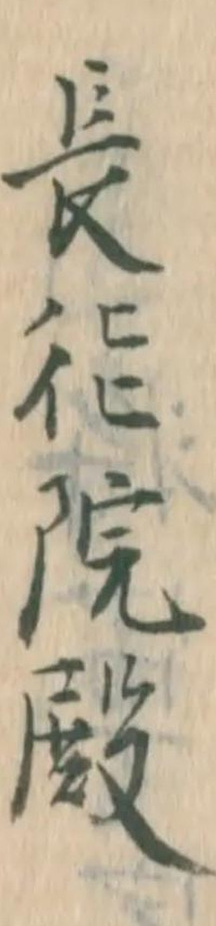長徳院殿
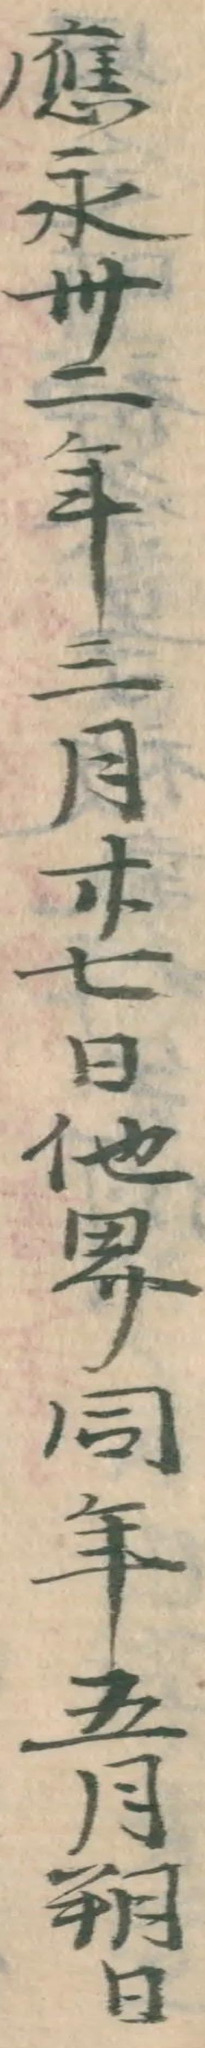応永卅二年三月廿七日他界同年五月朔日
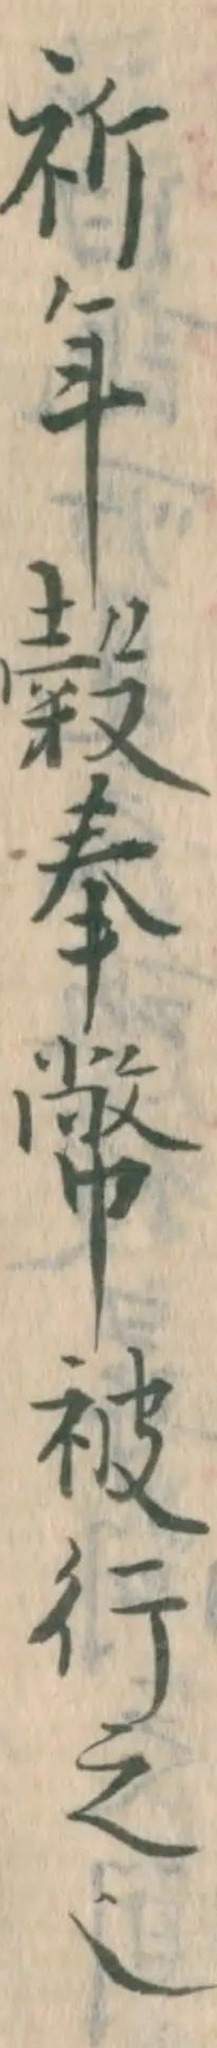祈年穀奉幣被行之也
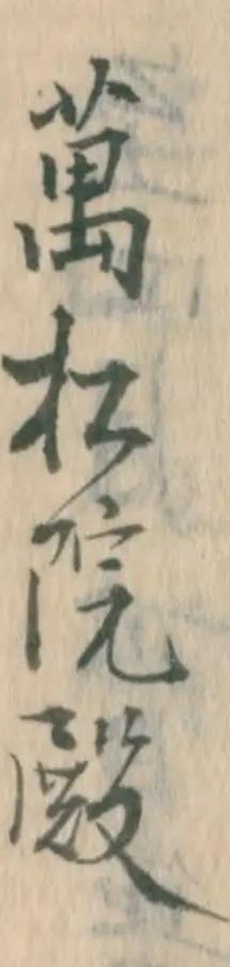萬松院殿
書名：賀茂社記録. 第10冊
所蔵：国立国会図書館 National Diet Library, JAPAN
